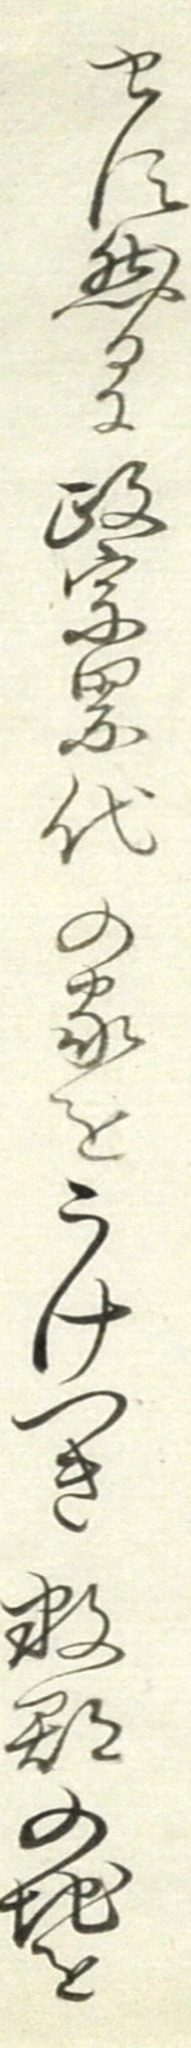せす然るに政宗累代の家をうけつき数郡の地を
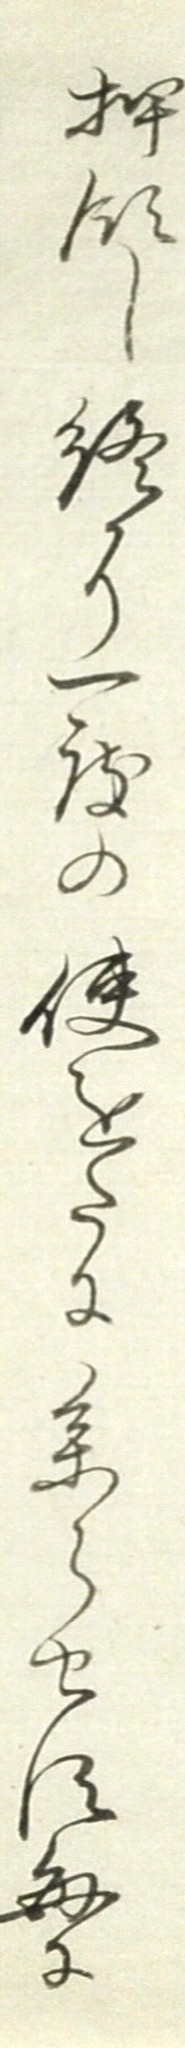押領し終に一度の使をたに参らせす毎に
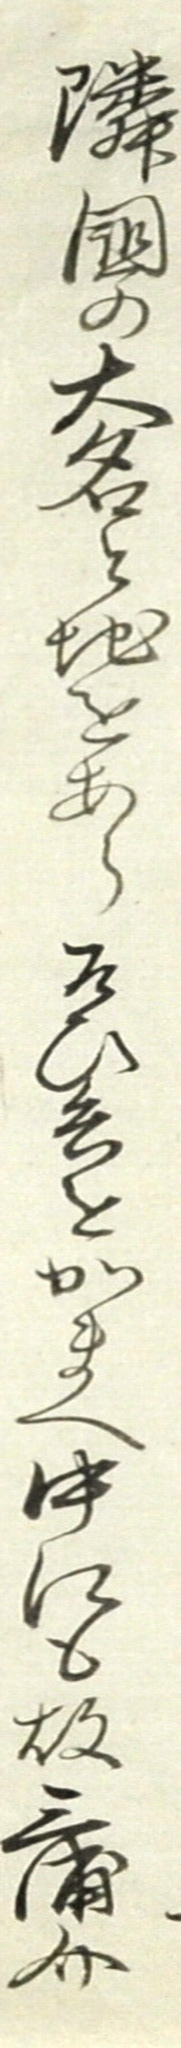隣国の大名と地をあらそひ兵をかまへ中にも故三浦介
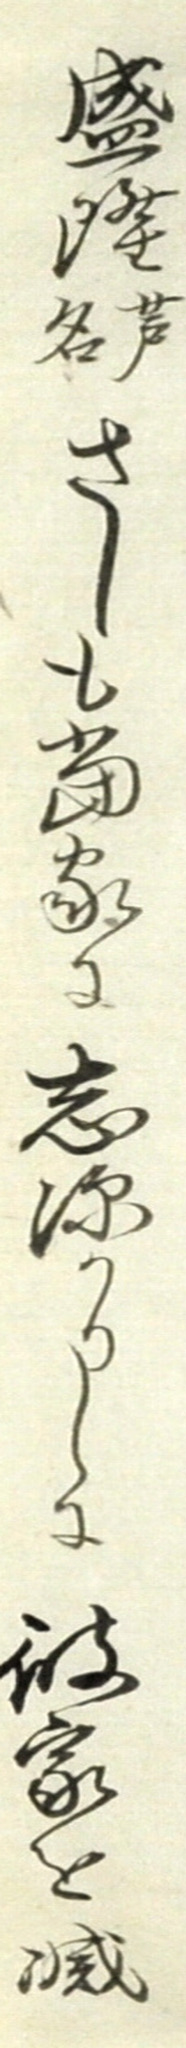盛隆蘆名さしも当家に志深かりしに彼家を滅
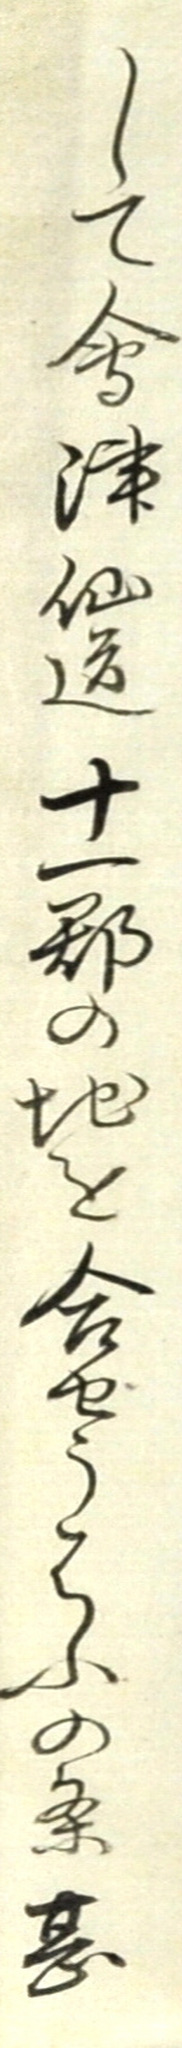して会津仙道十一郡の地を合せうはふの条甚

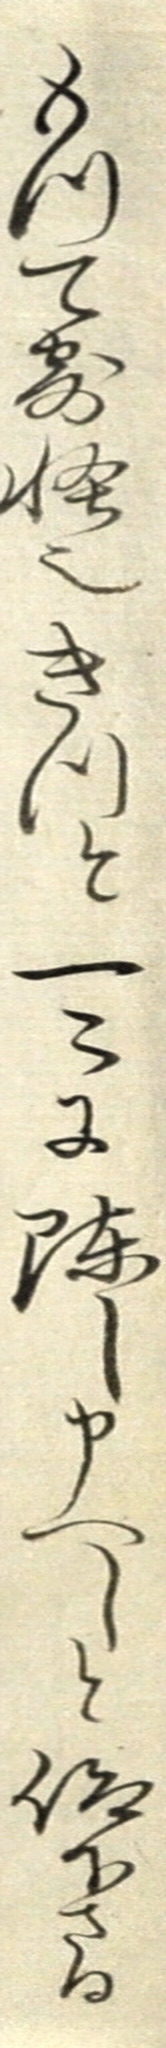もつて奇怪也きつと一々に陳し申へしと仰下さる
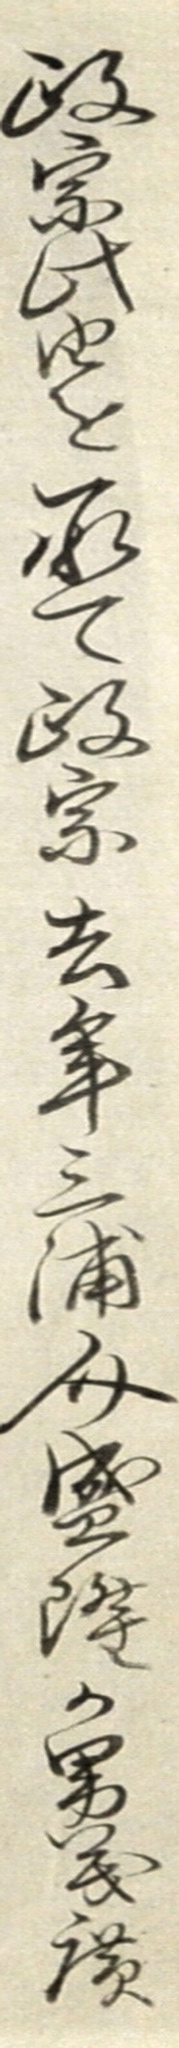政宗此由を承て政宗去年三浦介盛隆か男義広
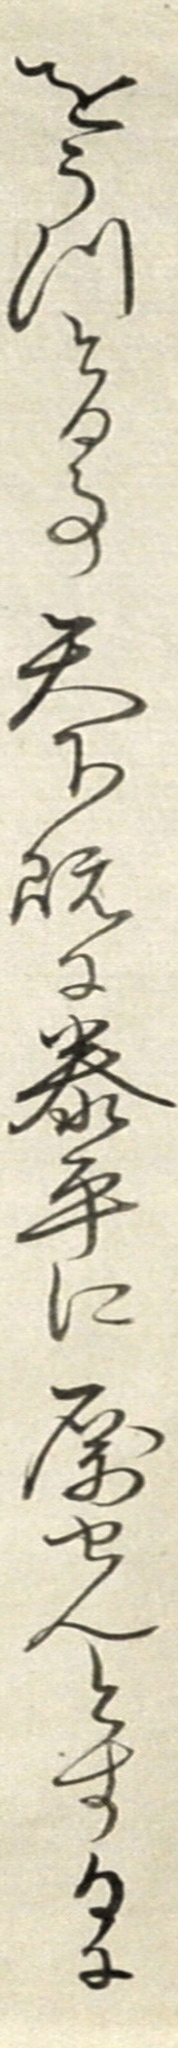をうつとる事天下既に泰平に属せんとするに
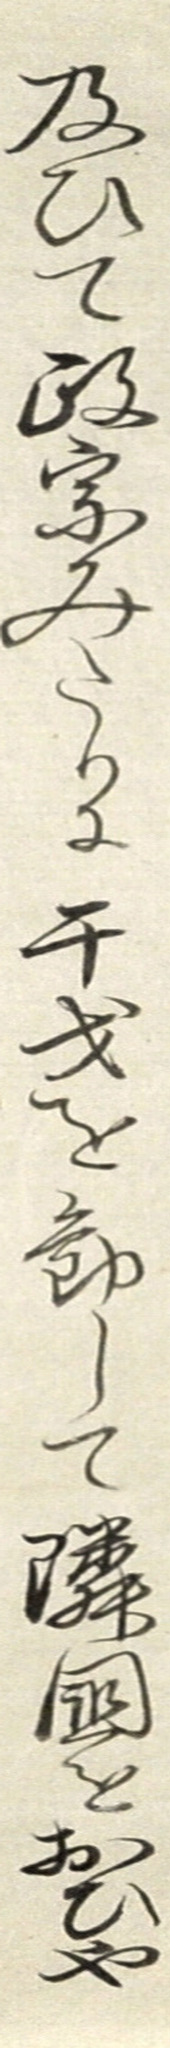及ひて政宗みたりに干戈を勧して隣国をおひや
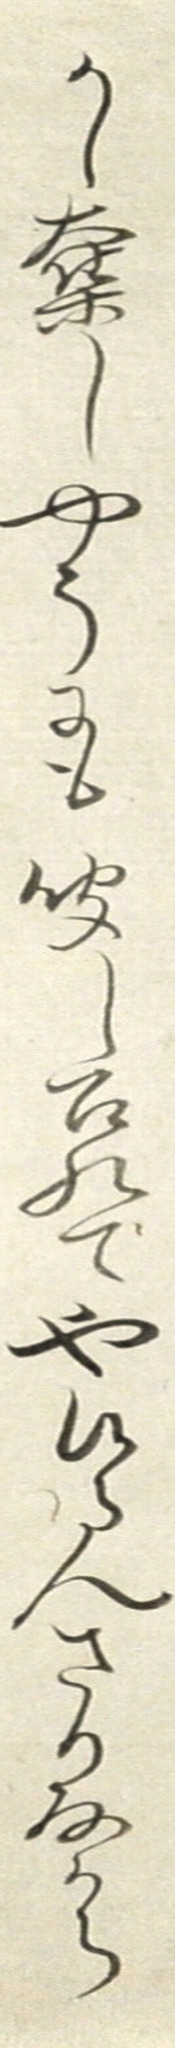かし奪しやうにも聞し召れてや候らんさりなから
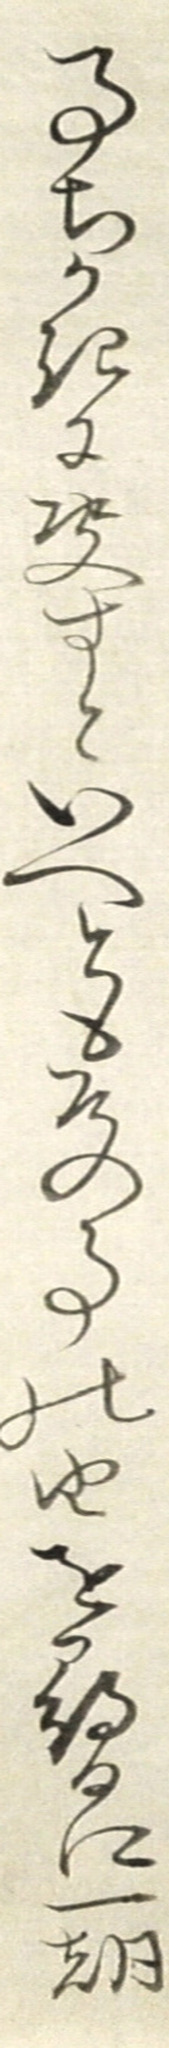事ちかきに決すといへともその事の由を尋るに一朝
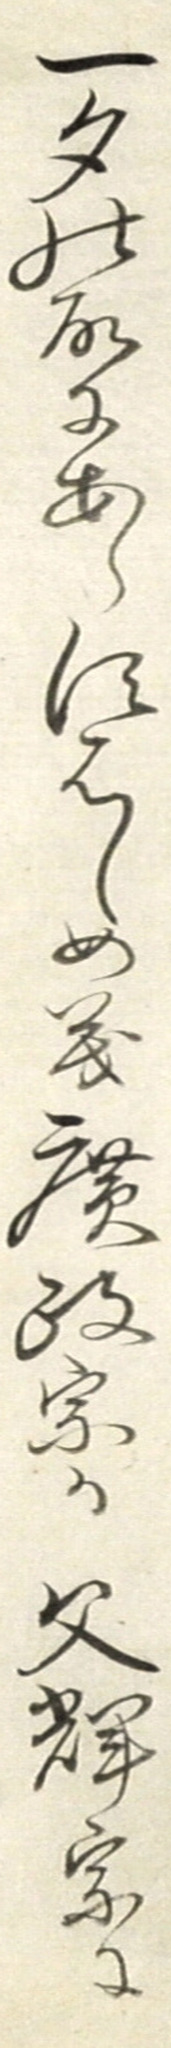一夕の故にあらすはしめ義広政宗か父輝宗に
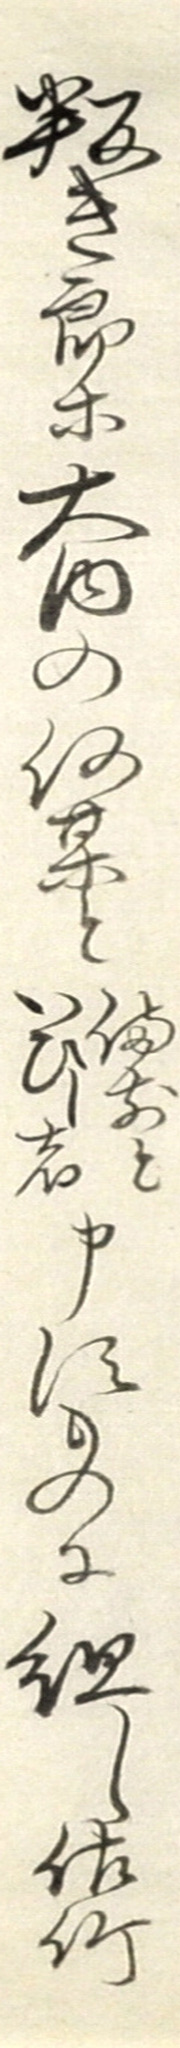叛き郎等大内の何某と備前といひし者申ものに組し佐竹
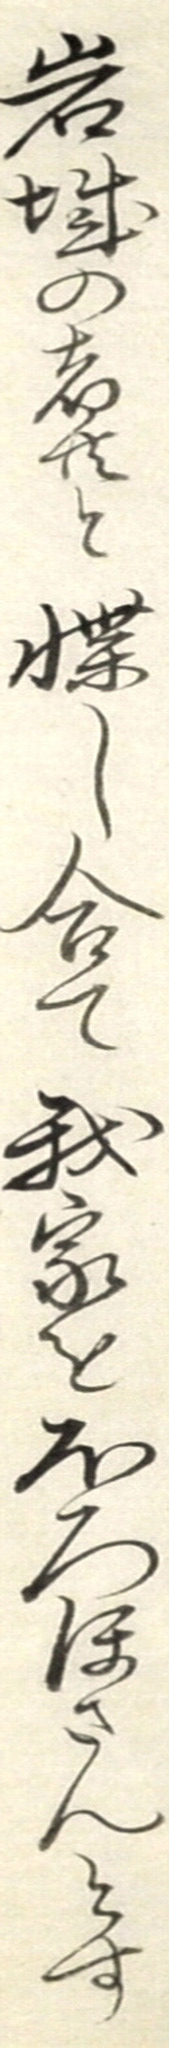岩城の者共し合て我家をほろほさんとす
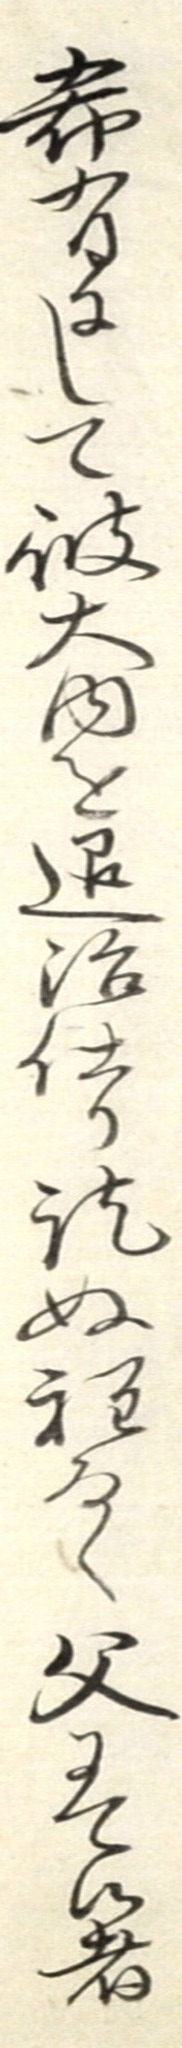希有にして彼大内を退治仕り訖ぬ程なく父にて候者
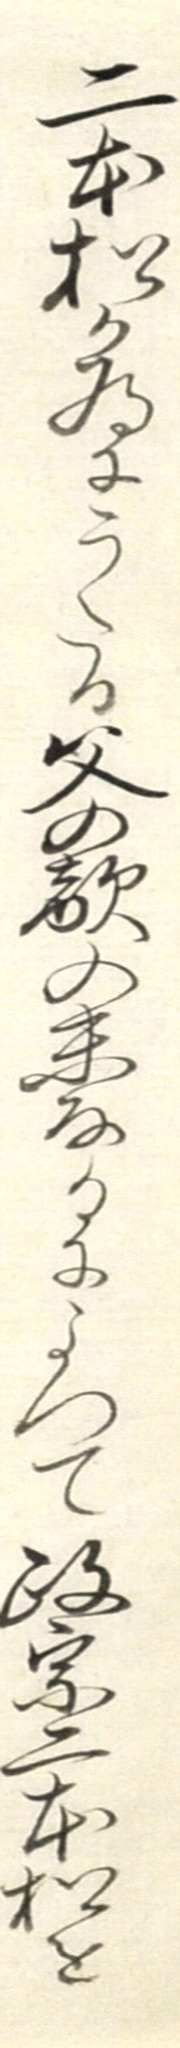二本松か為にうたる父の敵の末なるによつて政宗二本松を
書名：藩翰譜（七・下）
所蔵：伊那市立高遠町図書館・合同会社AMANE
